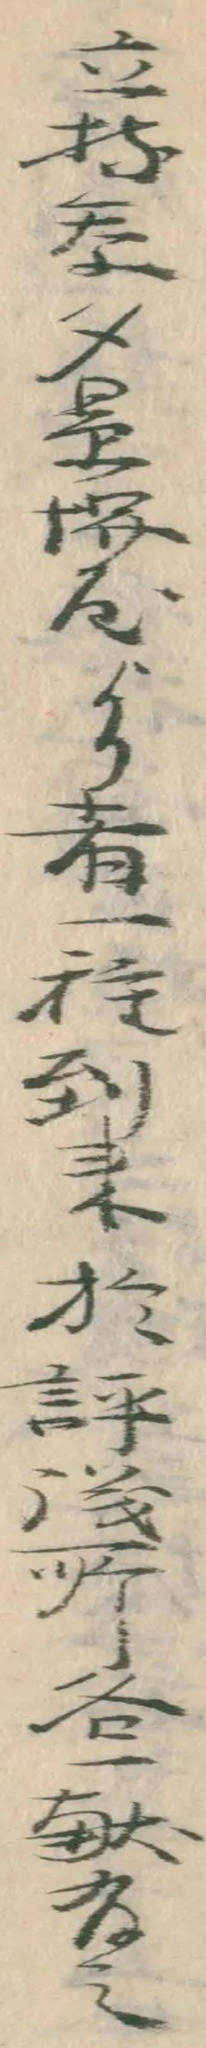立持参夕景堺屋より肴一種到来於評議所各一献有之
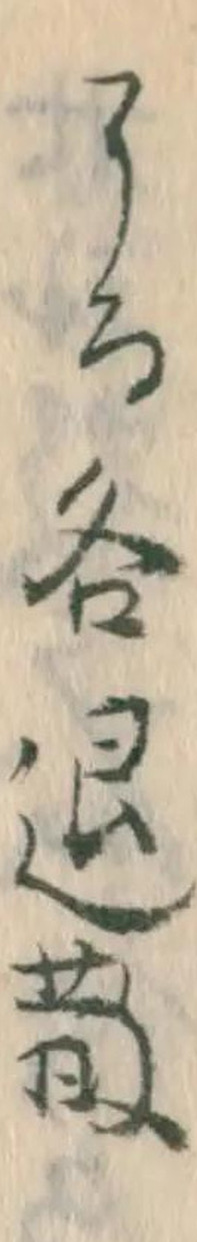了而各退散
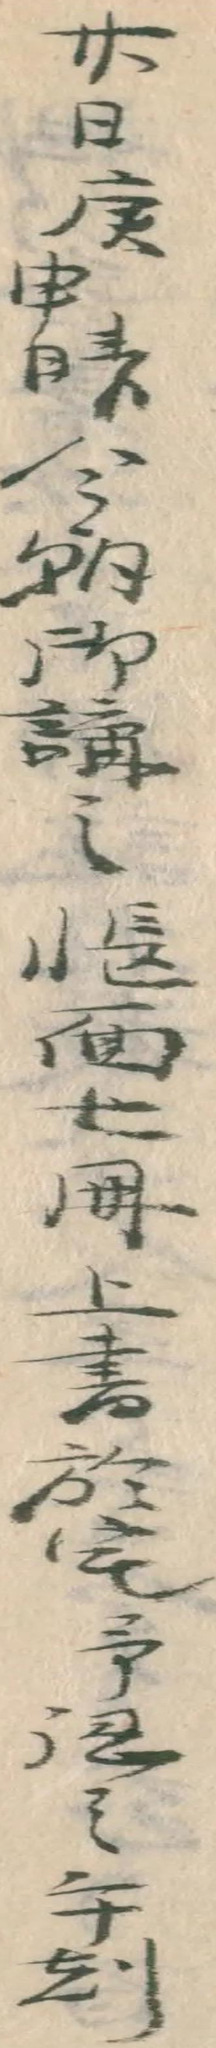廿日庚申晴今朝御講之帳面七冊上書於宅予認之午刻
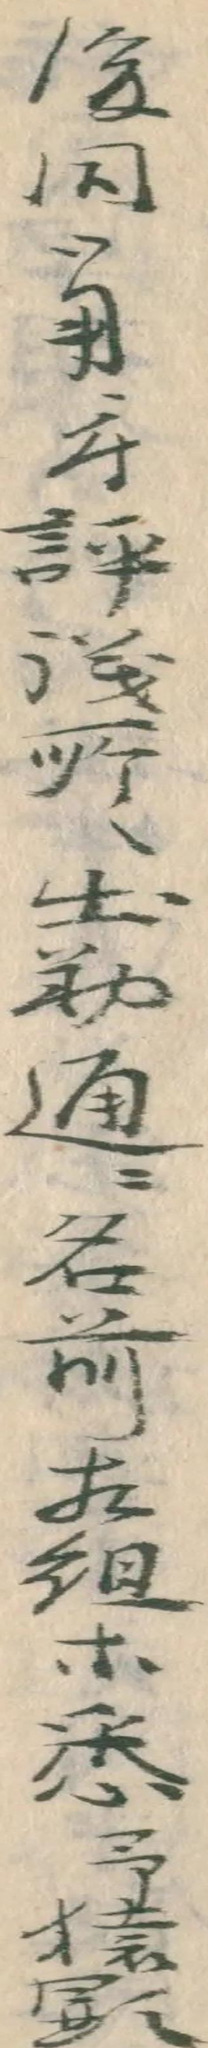後同御用ニ付評議所へ出勤通ニ名前相組等悉予猿顕
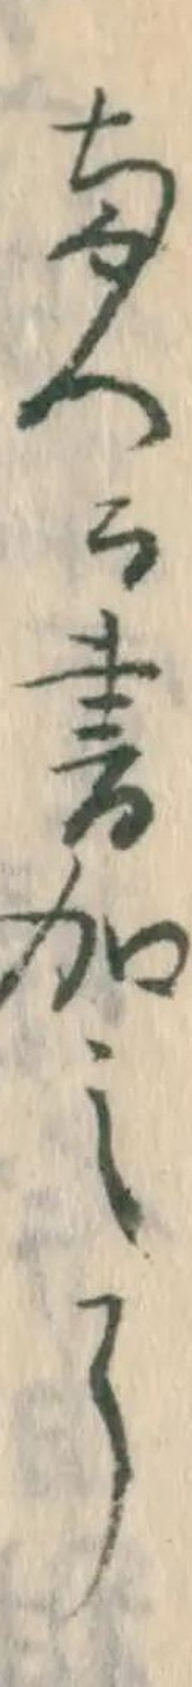両人而書加之了
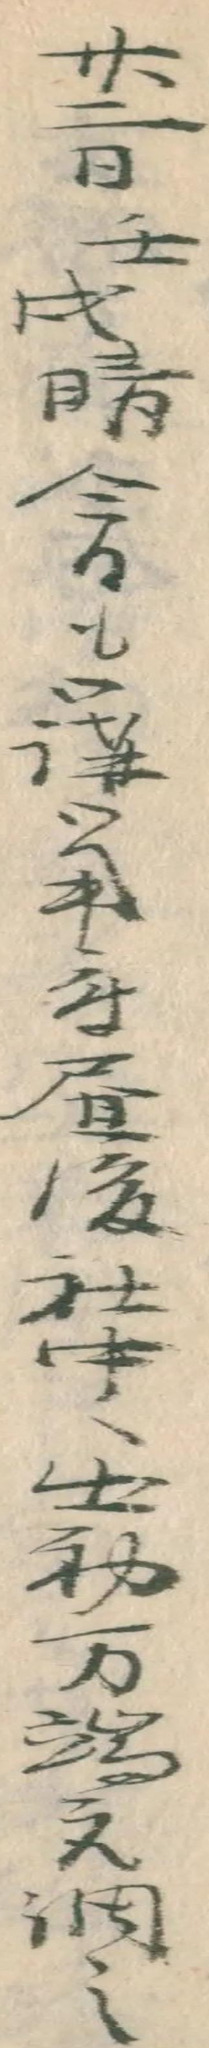廿二日壬戌晴今日も御講御用ニ付昼後社中へ出勤万端取調之
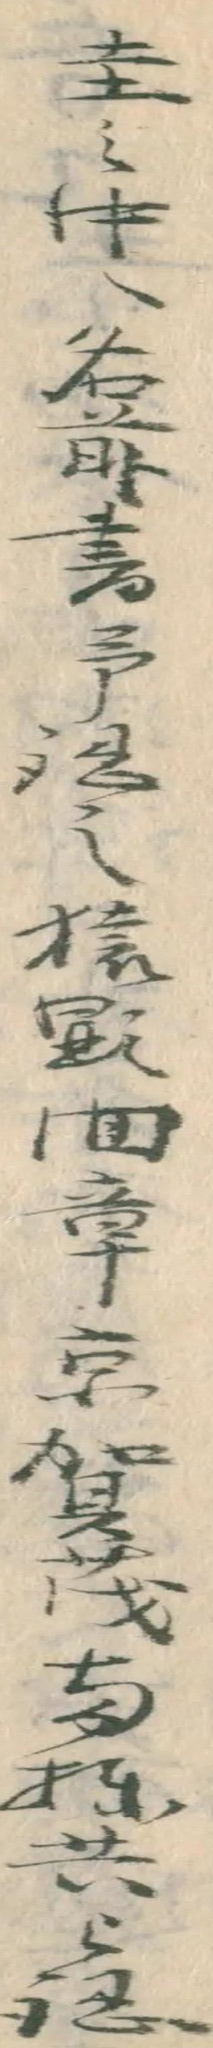圭之中へ名前書予認之猿顕回章京賀茂両棟共被認
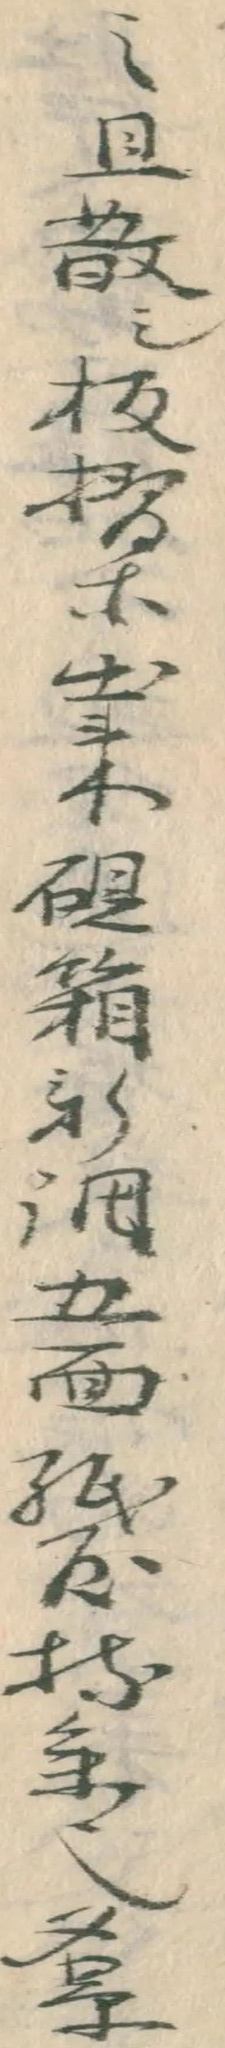之且散シ板摺等出来硯箱新調五面紙屋持参也夕景

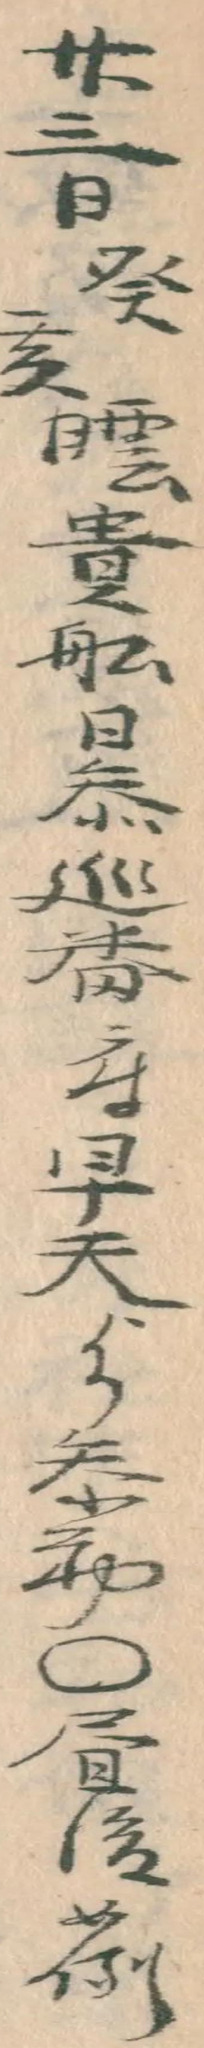廿三日癸亥曇貴船日参巡番ニ付早天より参勤○昼後如例
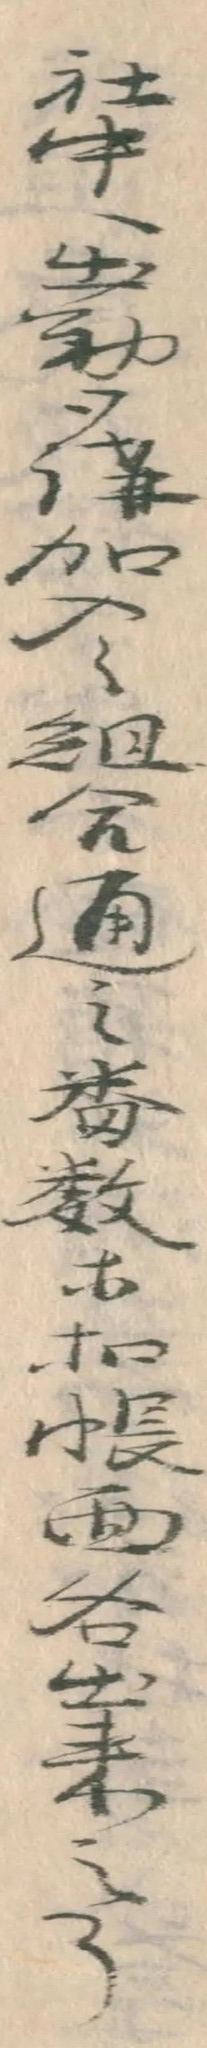社中へ出勤御講加入之組合通之番数等扣帳面各出来之了
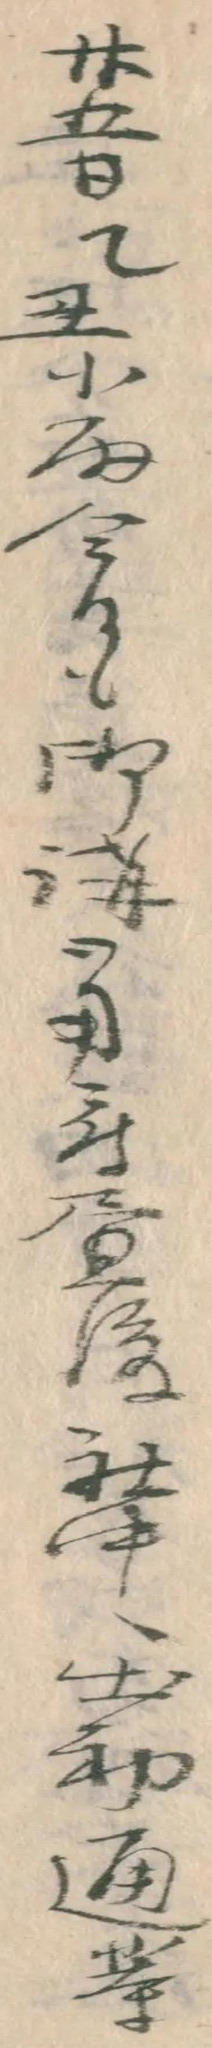廿五日乙丑小雨今日も御講御用に付昼後社中へ出勤通等
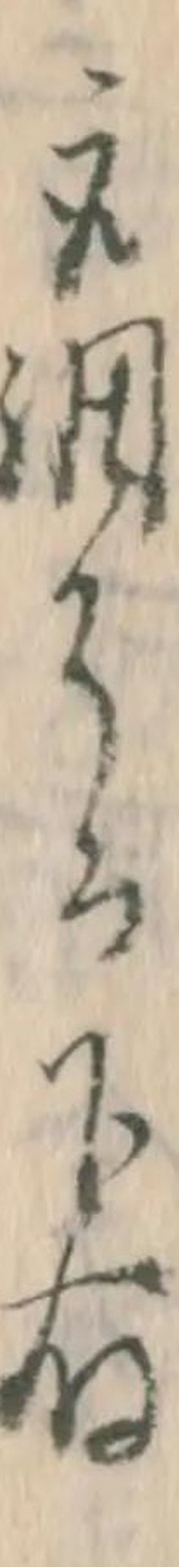取調了而下宿
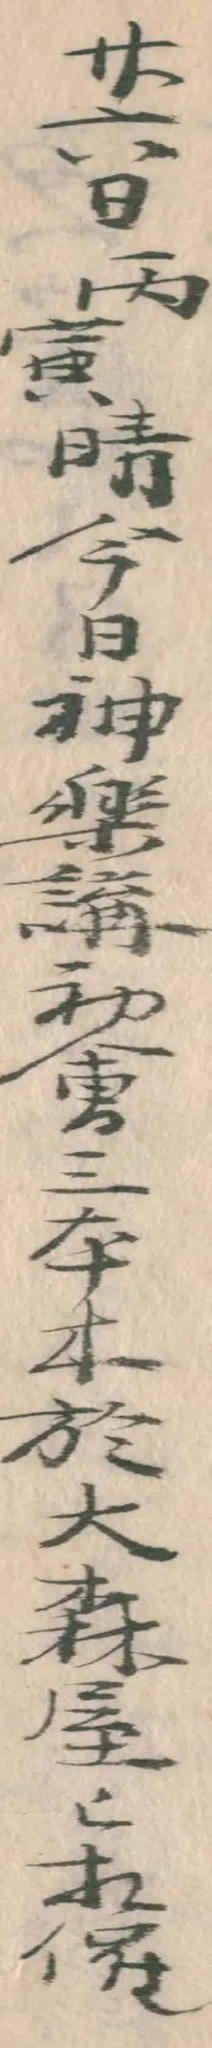廿六日丙寅晴今日神楽講初会三本木於大森屋被相催
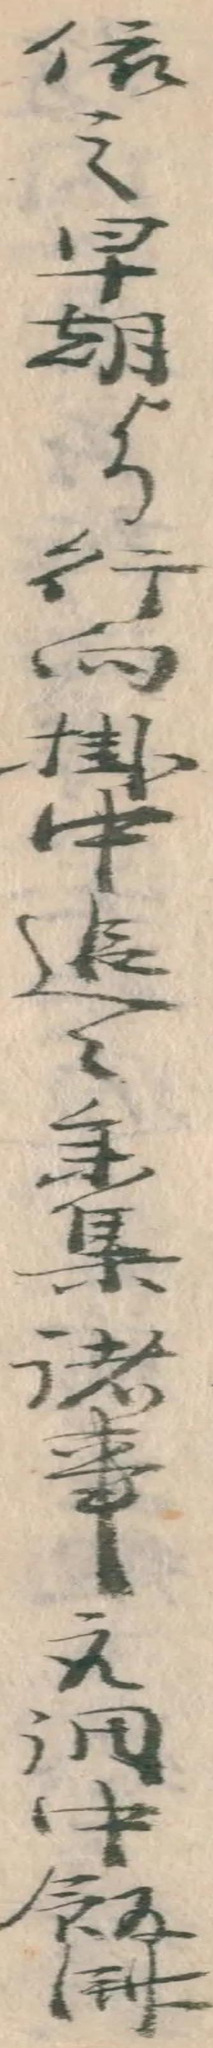依之早朝より行向掛中追々参集諸事取調中飯済
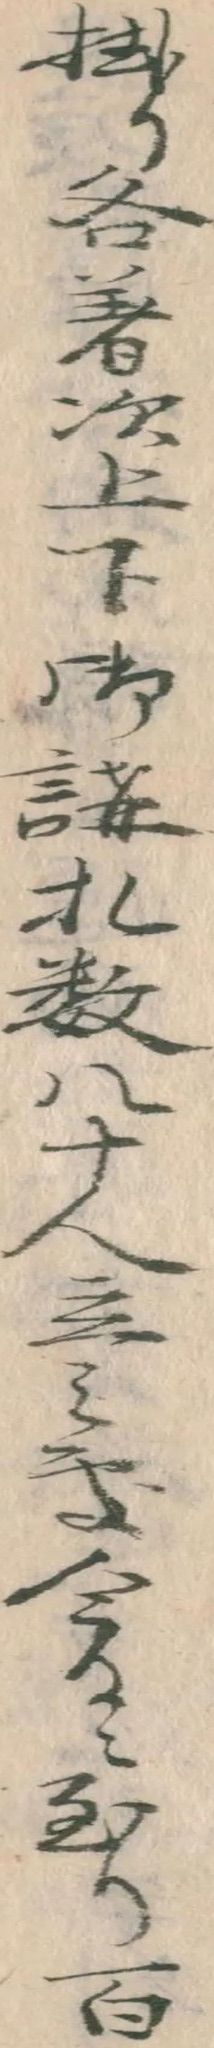掛り各着次上下御講札数八十人立之処今日に至り百
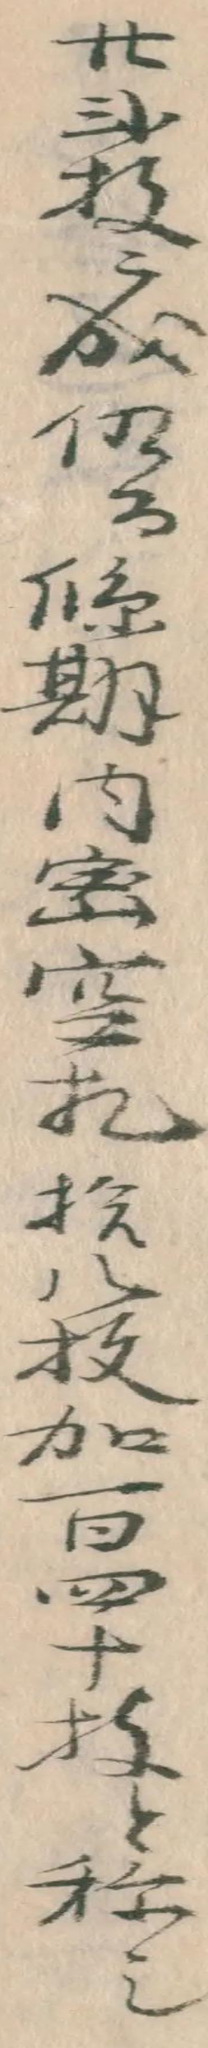廿弐枚に成仍而臨期内密空札拾八枚加百四十枚と称し
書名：賀茂社記録. 第64冊
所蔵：国立国会図書館 National Diet Library, JAPAN
